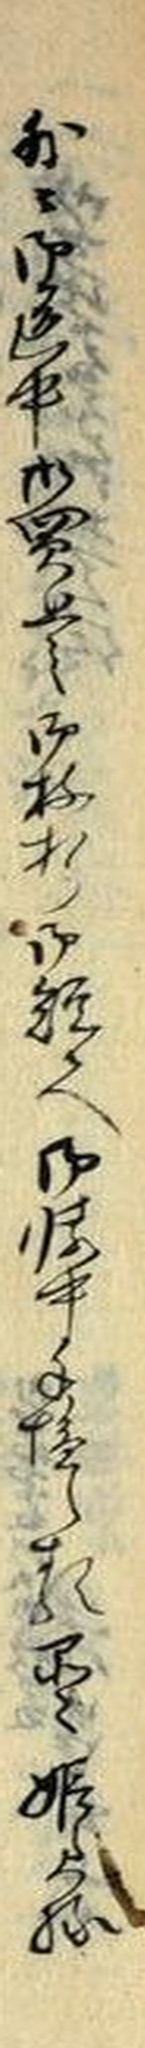外ニ御道中御買上之御枝折御短尺御懐中手塩之類品々姫君様
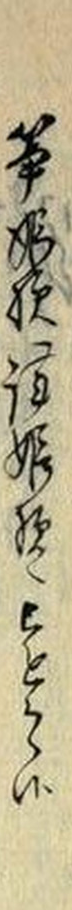箏姫様謹姫様へ被進之候
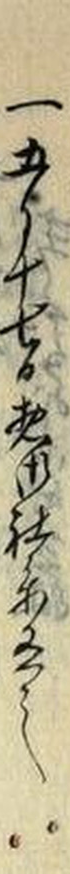一五月十七日惣御社参有之
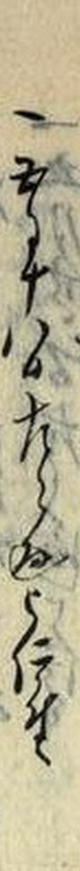一五月十八日左之通被仰付候
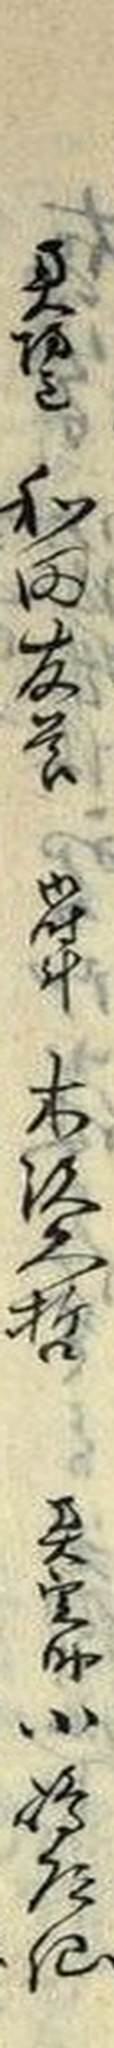奥坊主和田友節御時計木沢久哲奥定助小嶋道仙
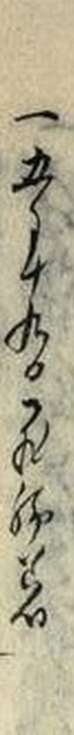一五月十九日飛脚着
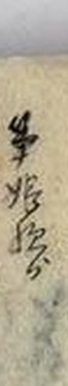箏姫様ゟ
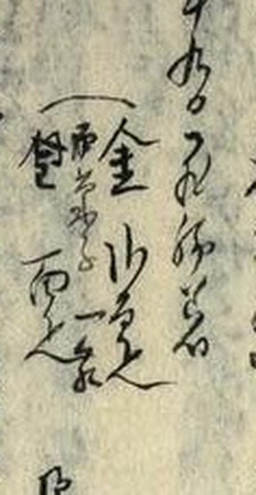金弐百疋
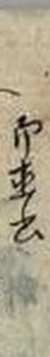御直書
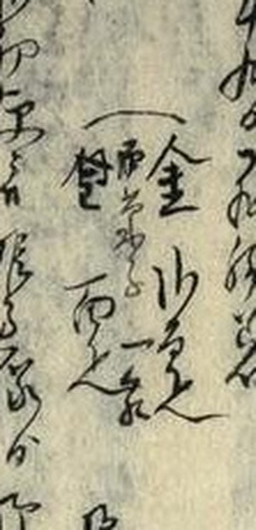御菓子一箱
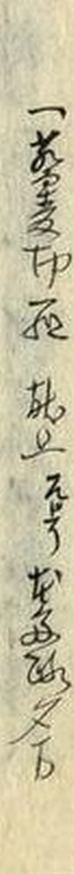一蕎麦切一組献上召上り本多路夕方
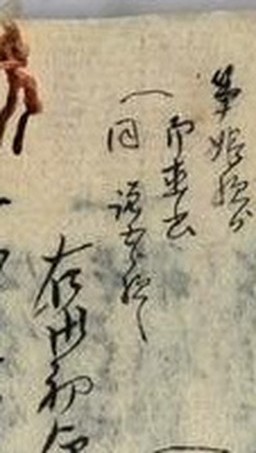同謙五郎様へ
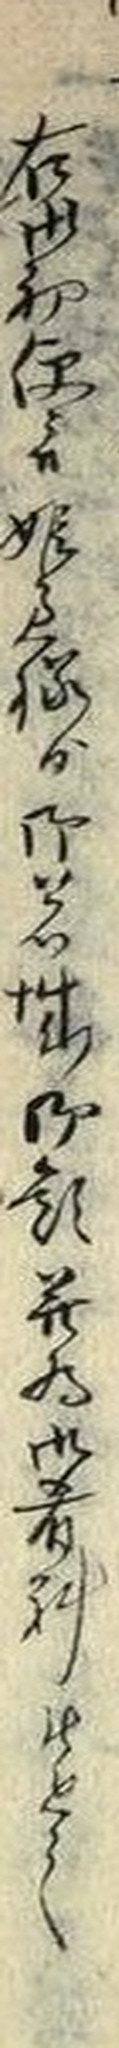右御初便ニ付姫君様ゟ御着城御歓幷為御肴料被進之
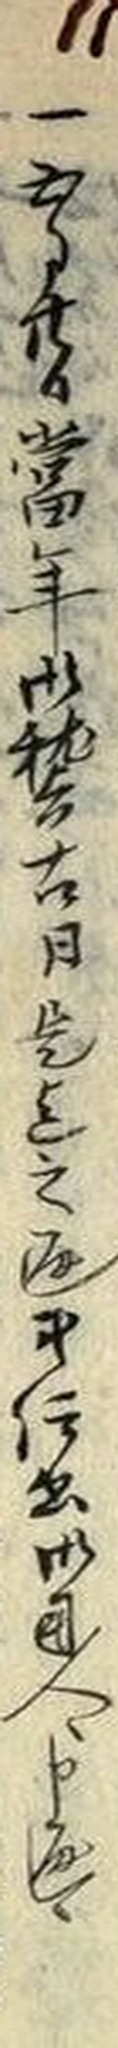一五月廿日当年御稽古日是迄之通被仰出御用人へ申通候
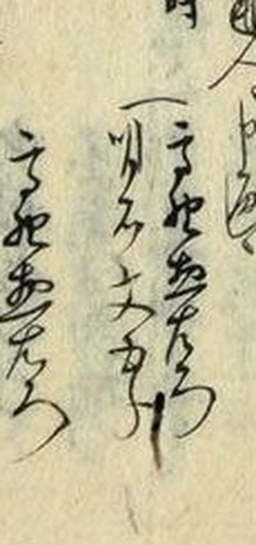明石文五郎
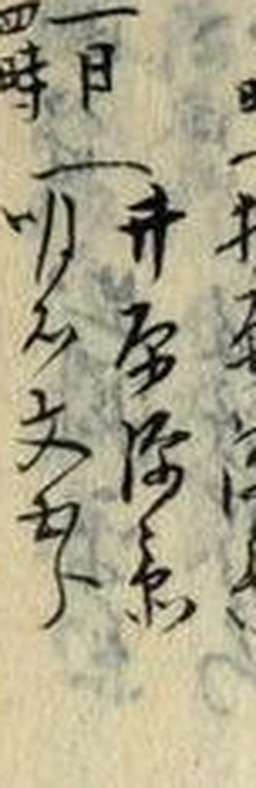明石文五郎
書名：少傅日録抄（斉承付側向頭取日記、在国）
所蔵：福井県文書館 Fukui Prefectural Archives
